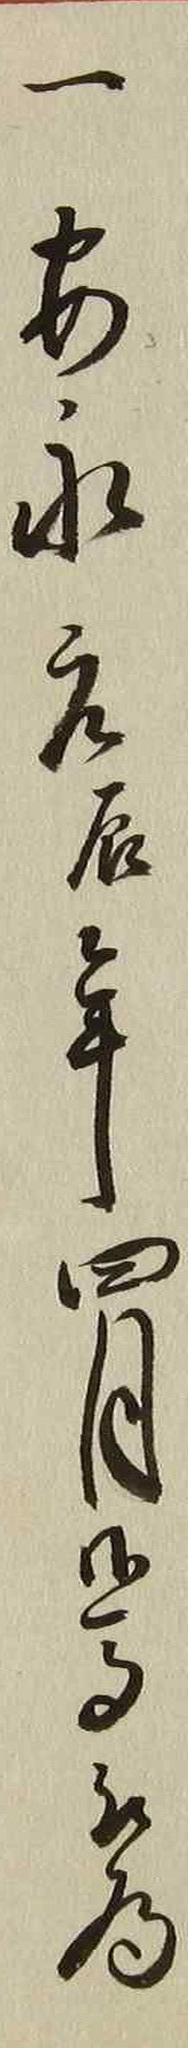一安永元辰年四月御馬被為
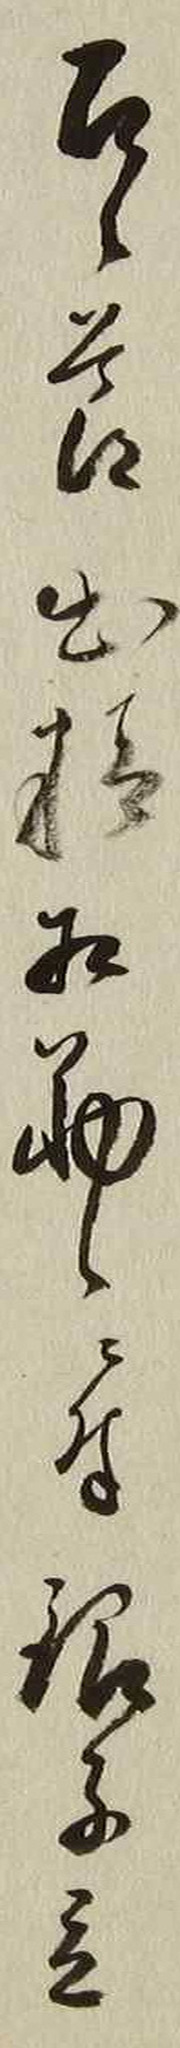召候節出精相勤候ニ付銀子壱
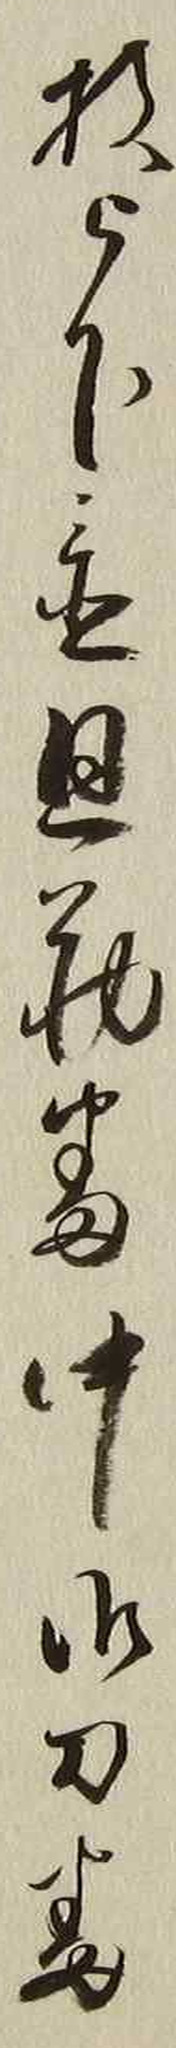枚被下置且勤番中御刀番
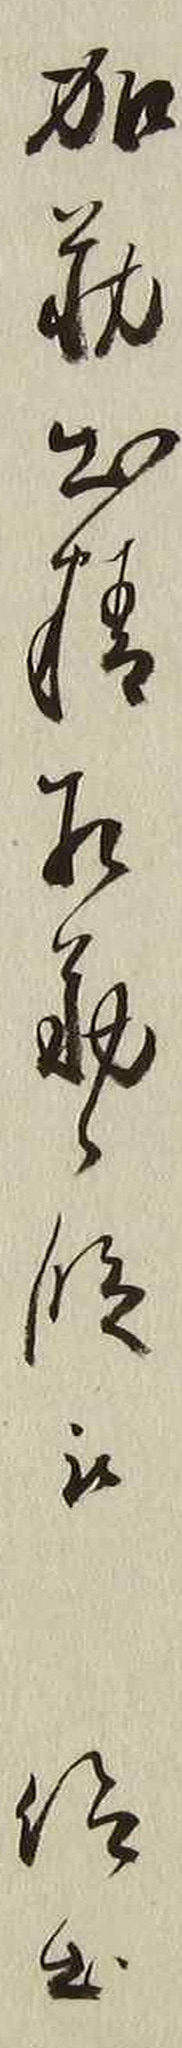加番出精相勤候段被仰出
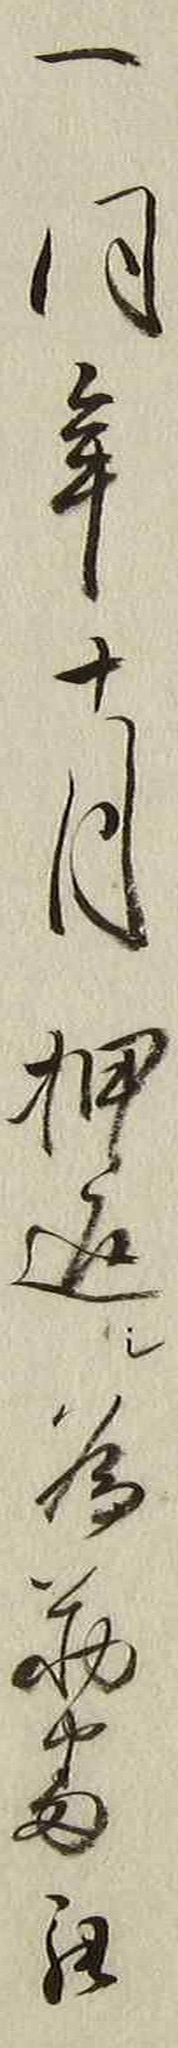一同年十月押返シ為勤番罷
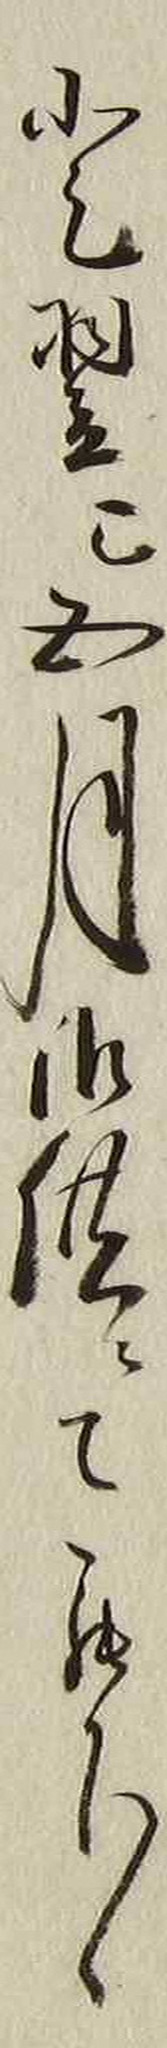登翌巳五月御供ニて罷下候
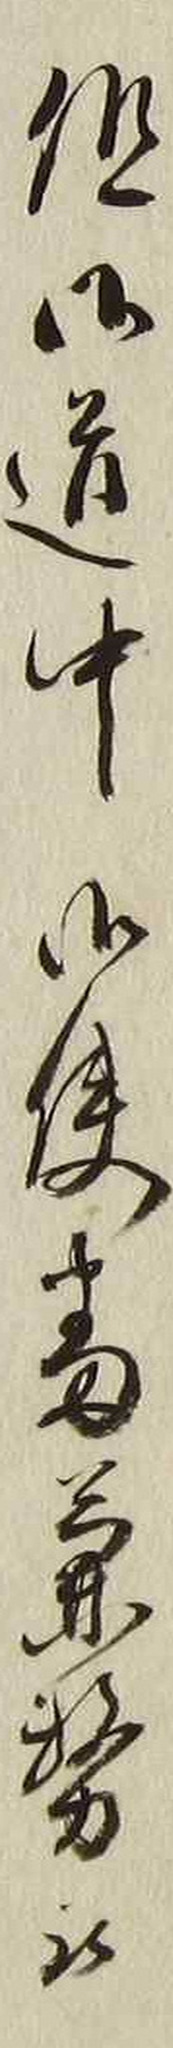但御道中御使番兼務被
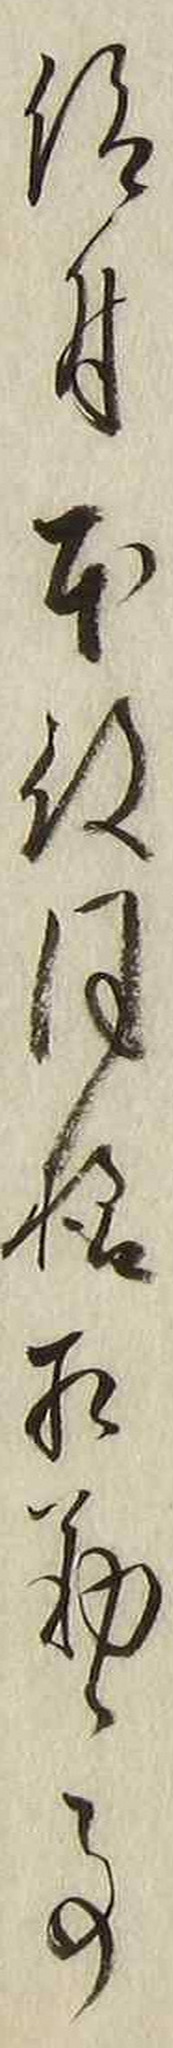仰付本役同様相勤候事
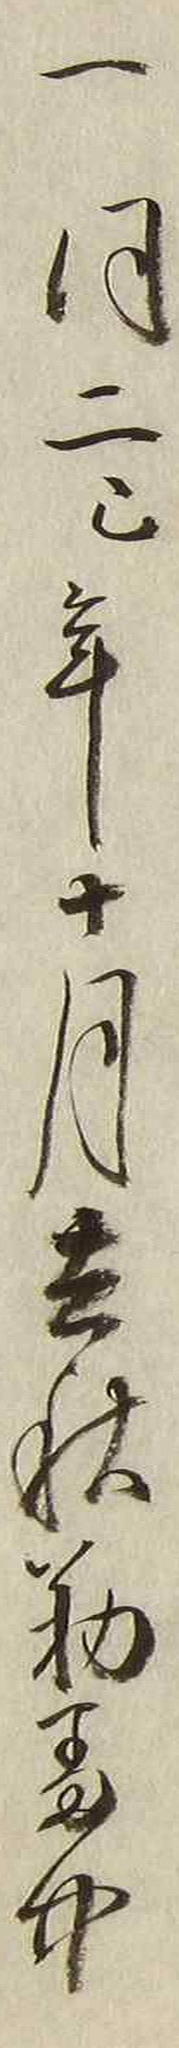一同二巳年十月去秋勤番中
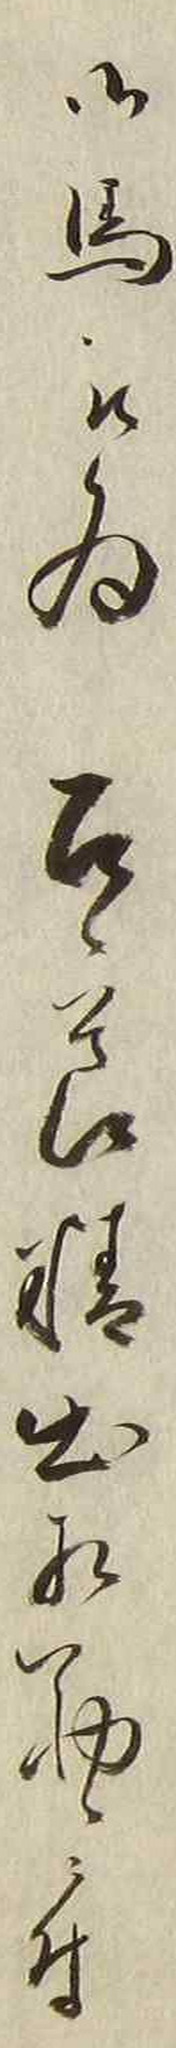御馬被為召候節精出相勤候ニ付

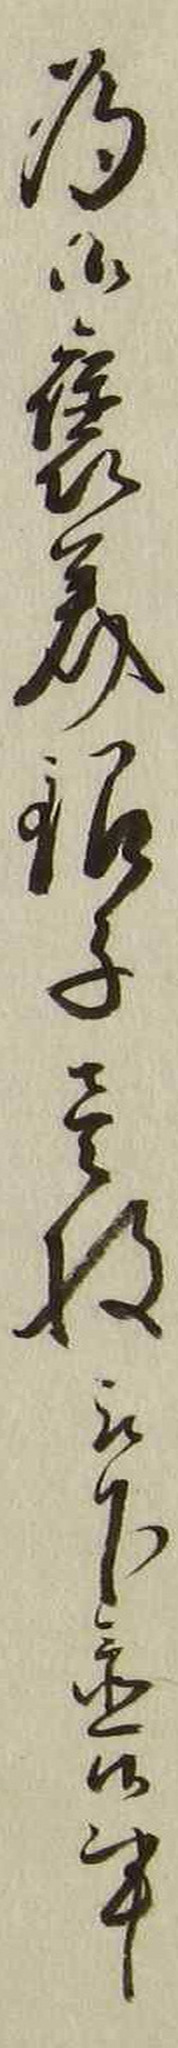為御褒美銀子壱枚被下置候事
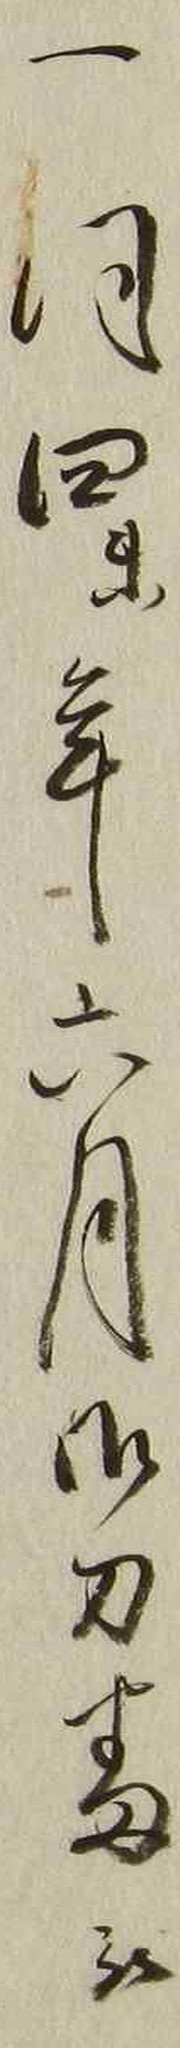一同四未年六月御刀番被
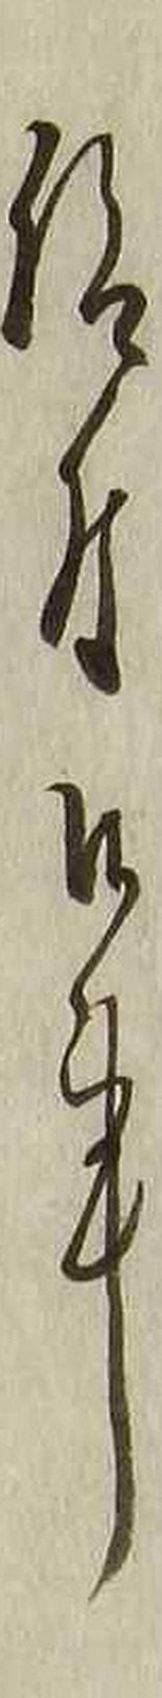仰付候事
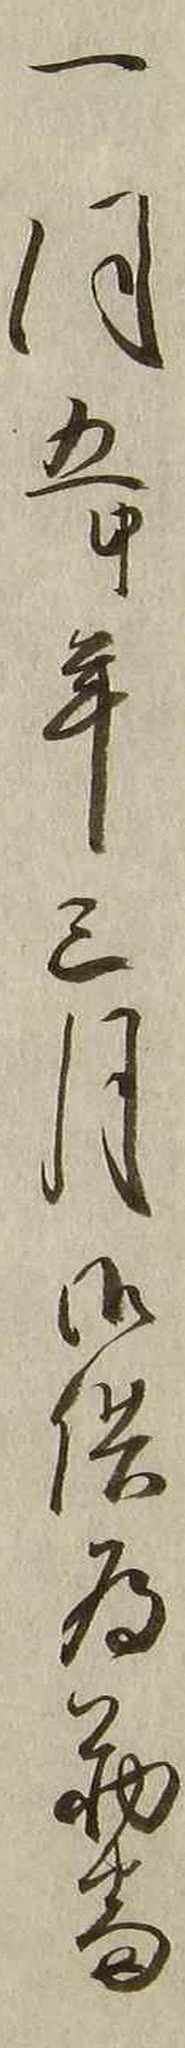一同五申年三月御供為勤番
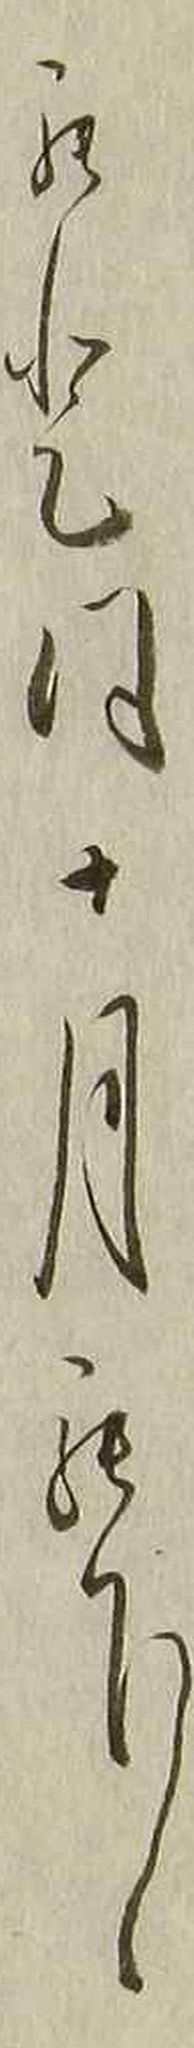罷登同十月罷下候
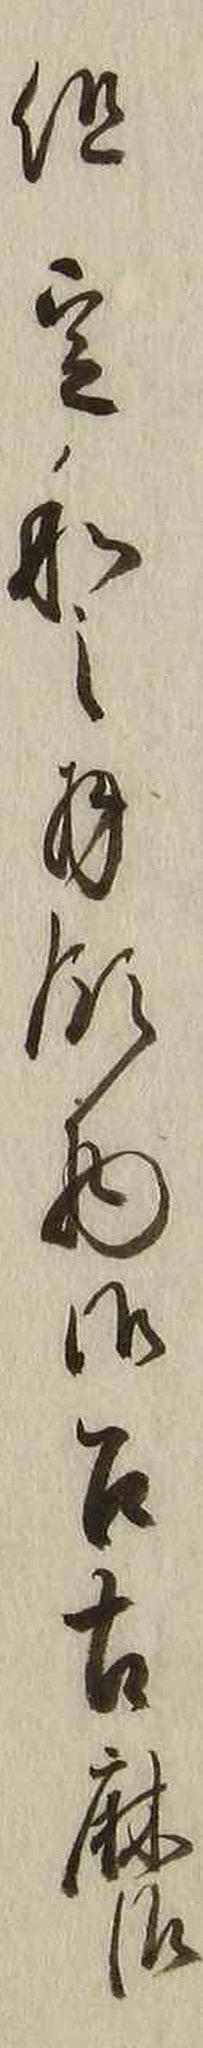但定和之拝領物御召古麻御
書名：諸士系譜　巻之18　い之部18
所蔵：会津若松市立会津図書館
